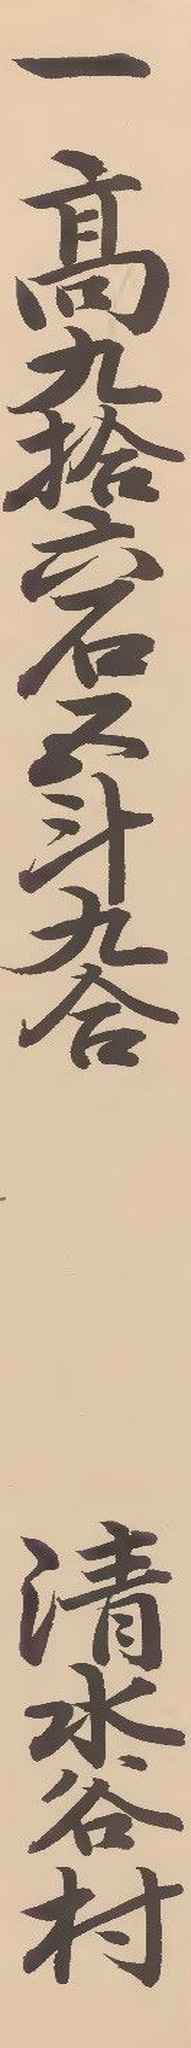一高九拾六石五斗九合清水谷村
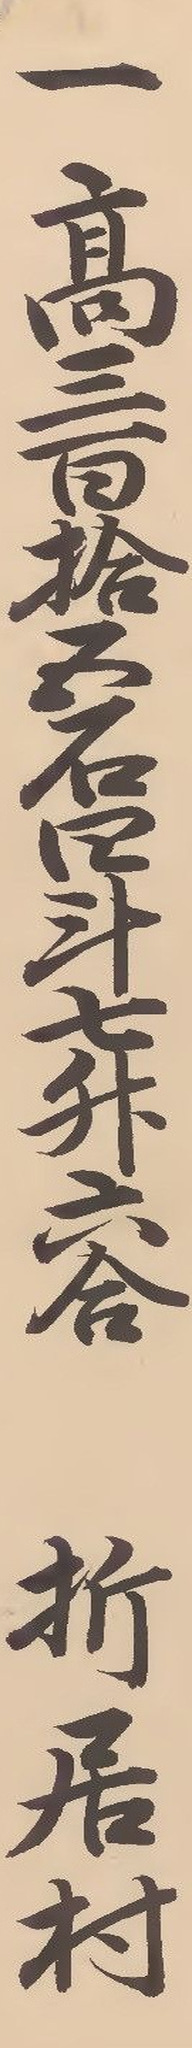一高三百拾五石四斗七升六合折居村
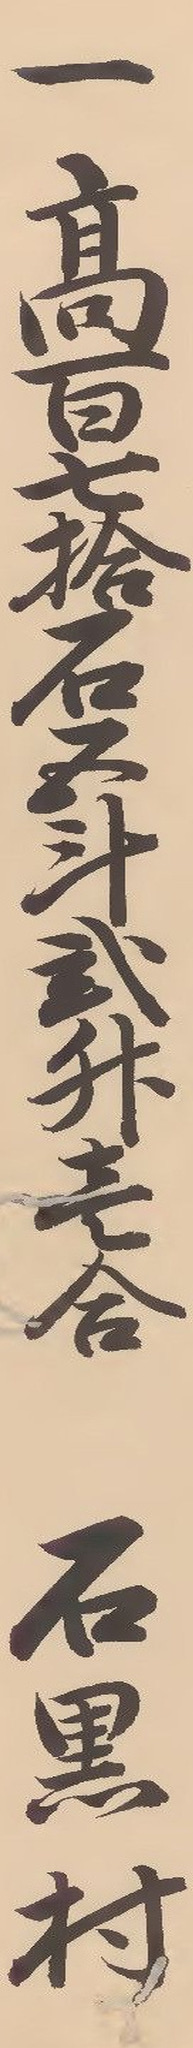一高百七拾石五斗弐升壱合石黒村

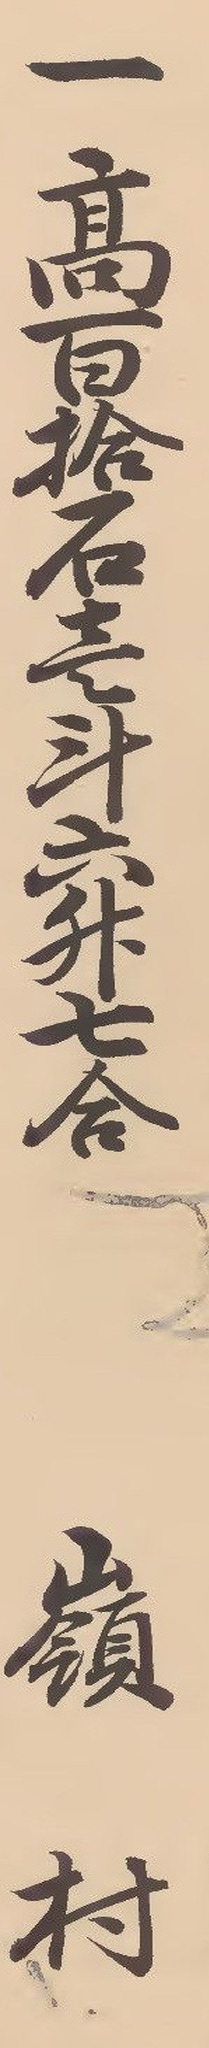一高百拾石壱斗六升七合嶺村
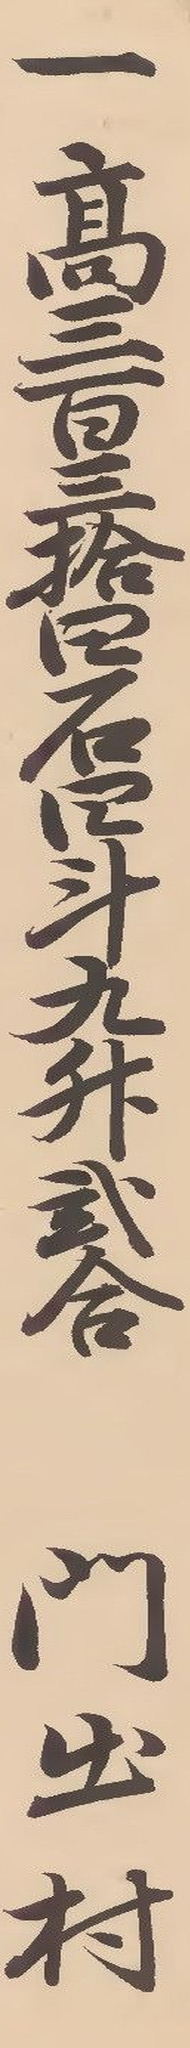一高三百三拾四石四斗九升弐合門出村
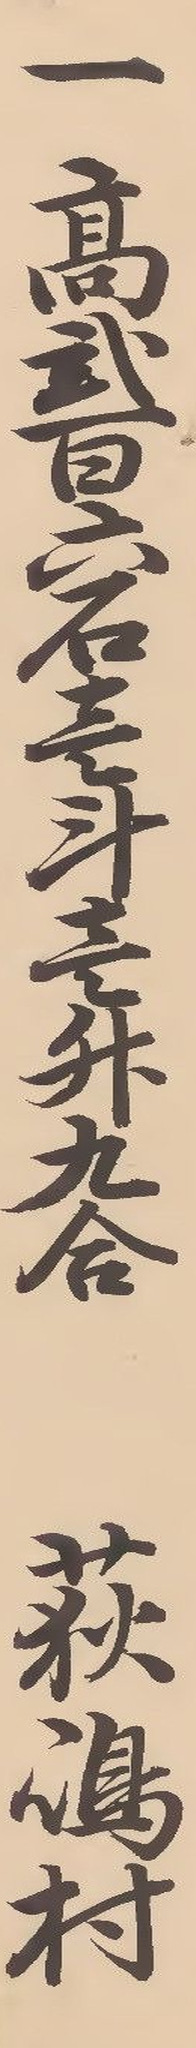一高弐百六石壱斗壱升九合荻嶋村
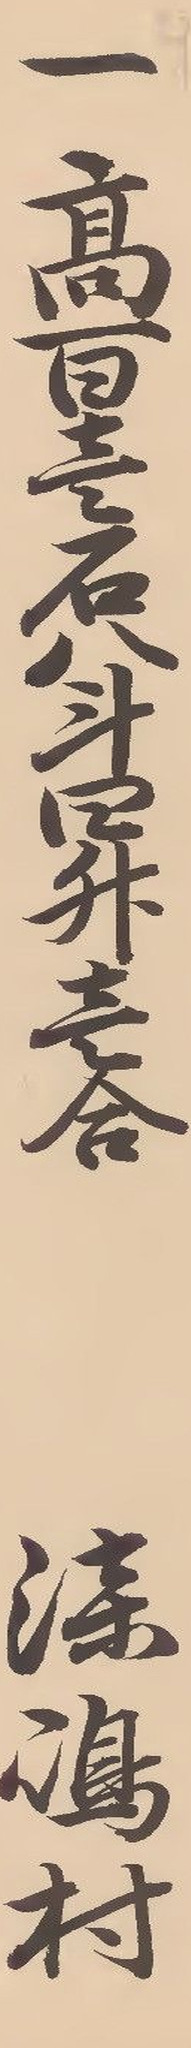一高百壱石八斗四升壱合漆嶋村
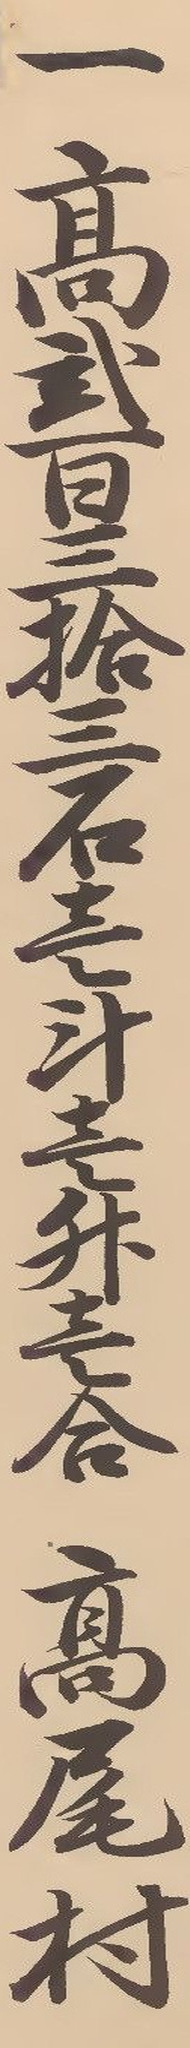一高弐百三拾三石壱斗壱升壱合高尾村
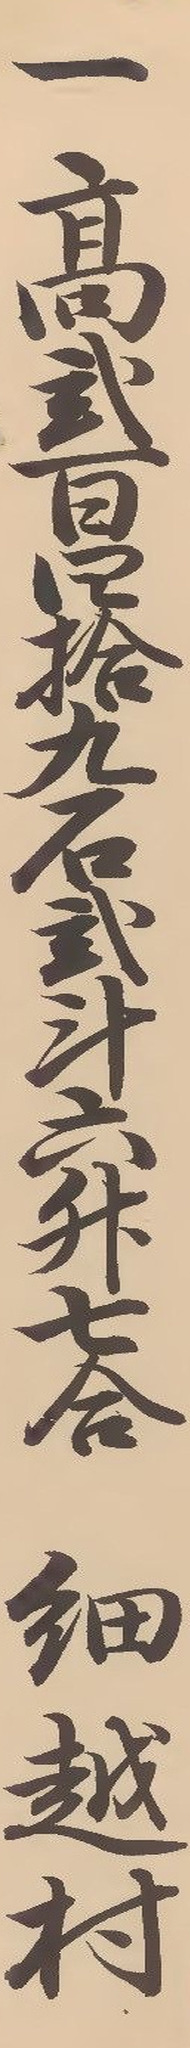一高弐百四拾九石弐斗六升七合細越村
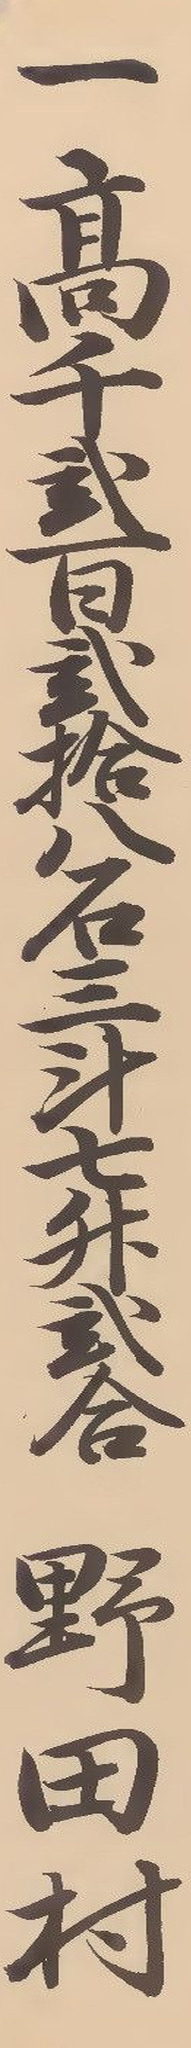一高千弐百弐拾八石三斗七升弐合野田村
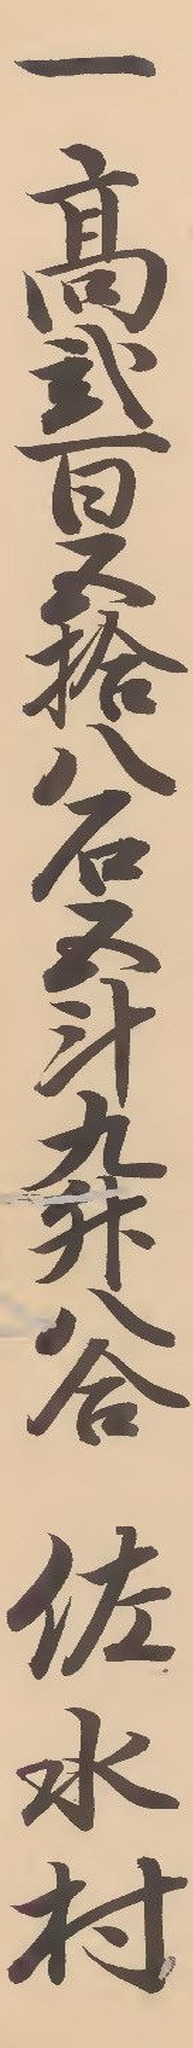一高弐百五拾八石五斗九升八合佐水村

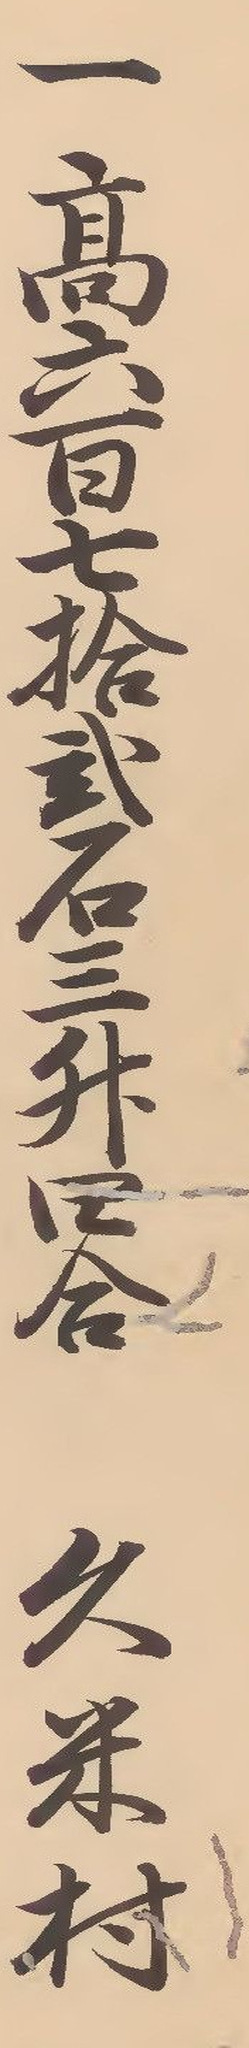一高六百七拾弐石三升四合久米村
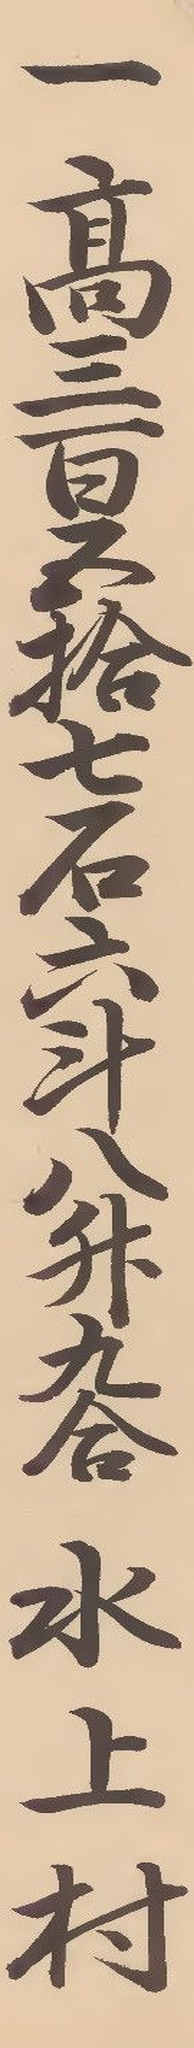一高三百五拾七石六斗八升九合水上村
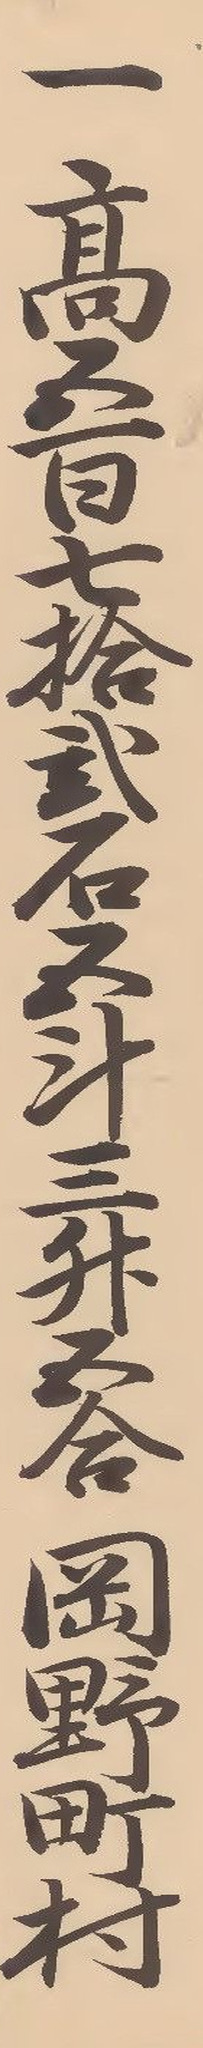一高五百七拾弐石五斗三升五合岡野町村
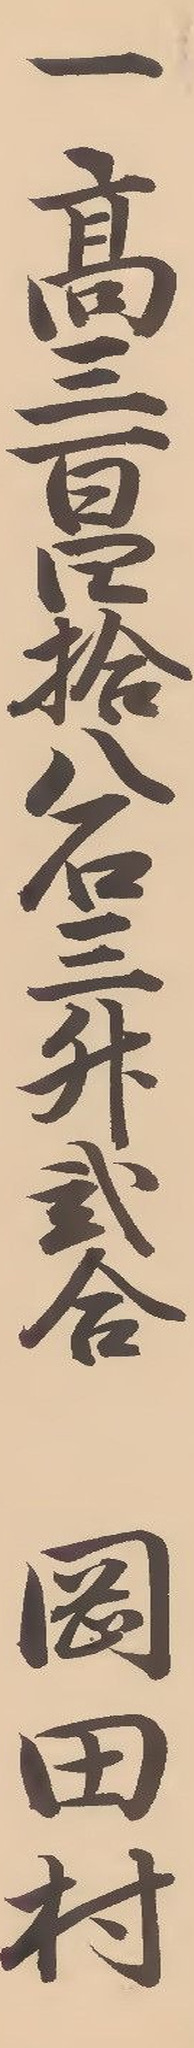一高三百四拾八石三升弐合岡田村
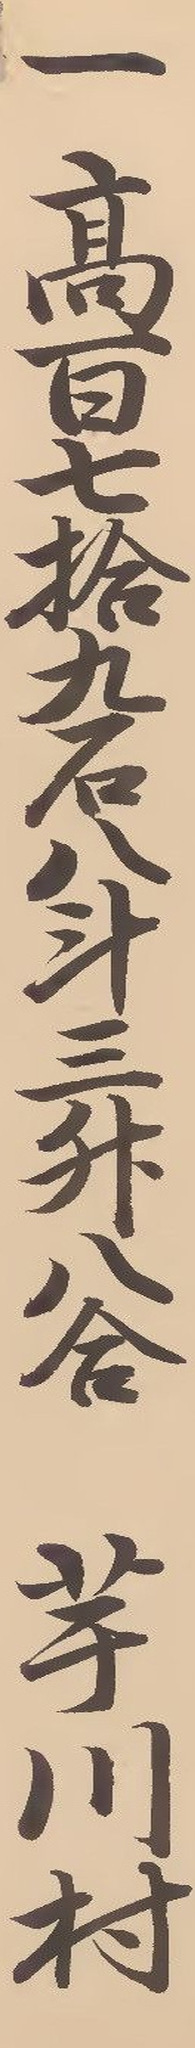一高百七拾九石八斗三升八合芋川村
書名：越後国郷帳　中
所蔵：国立公文書館 National Archives of Japan
